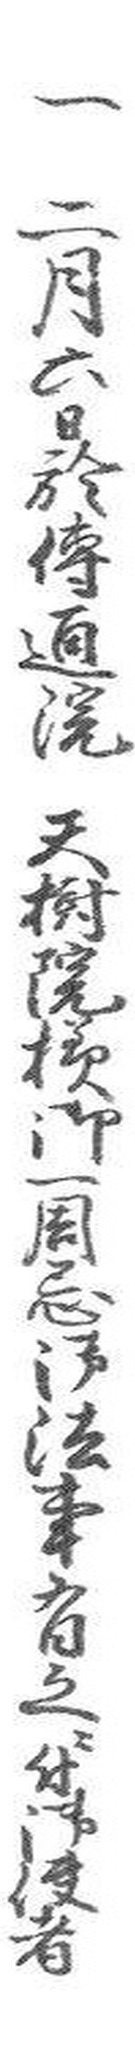一二月六日於伝通院天樹院様御一周忌御法事有之ニ付御使者
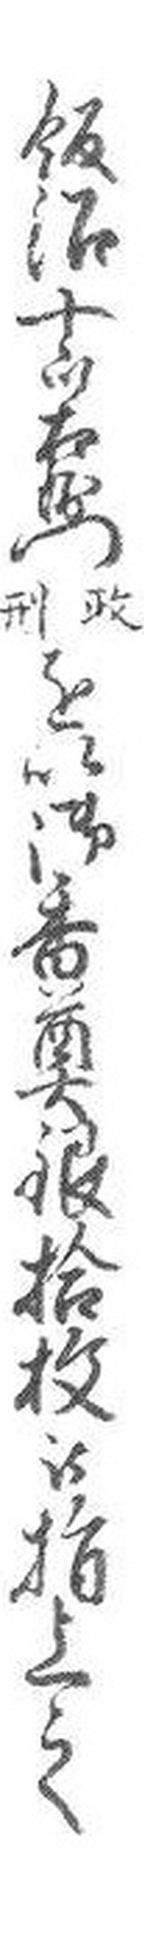飯沼十郎右衛門政刑を以御香奠銀拾枚被指上之
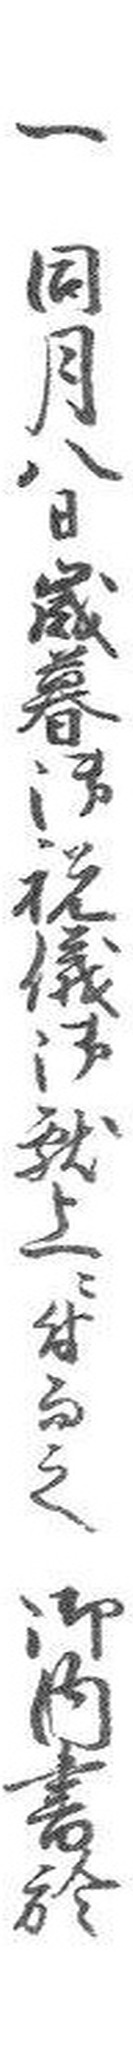一同月八日歳暮御祝儀御献上ニ付而之御内書於
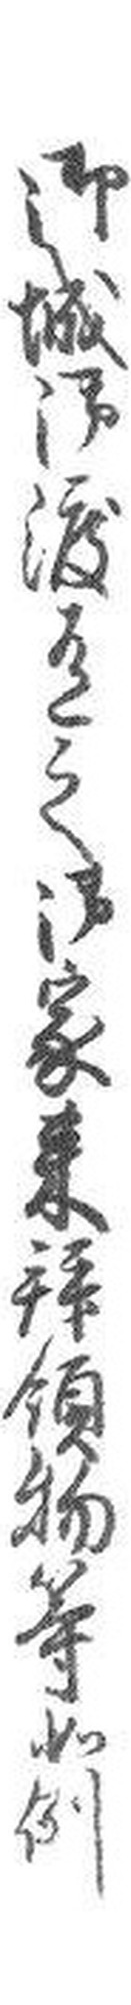御城御渡有之御家来拝領物等如例
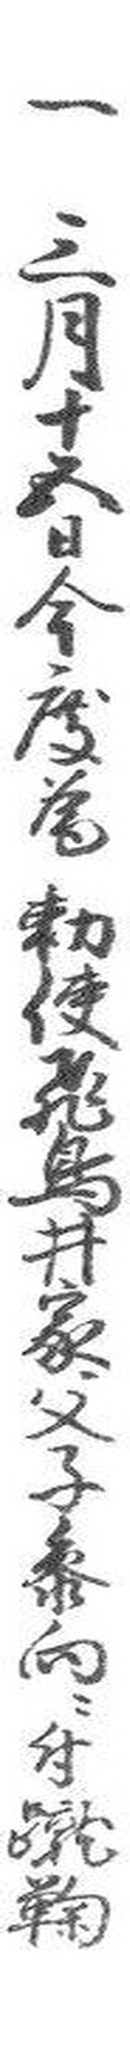一三月十五日今度為勅使飛鳥井家父子参向ニ付蹴鞠
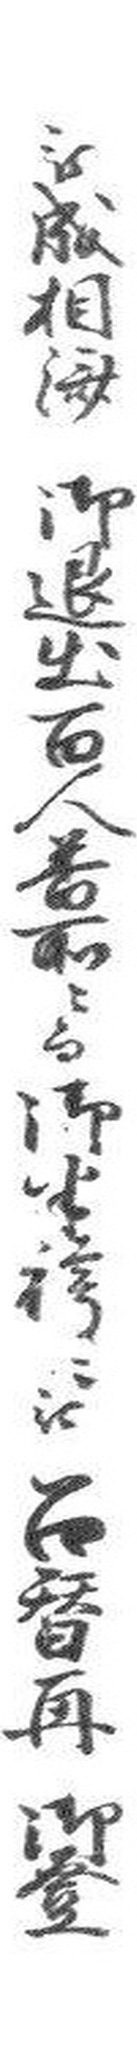被成相済御退出百人番所ニ而御半袴ニ被召替再御登
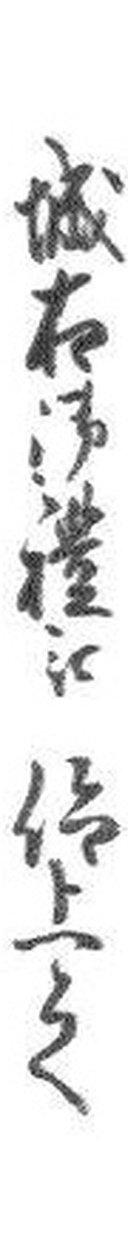城右御礼被仰上之
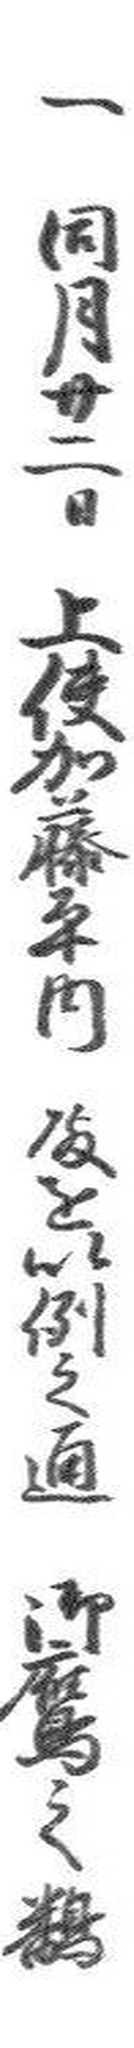一同月廿二日上使加藤平内殿を以例之通御鷹之鷭
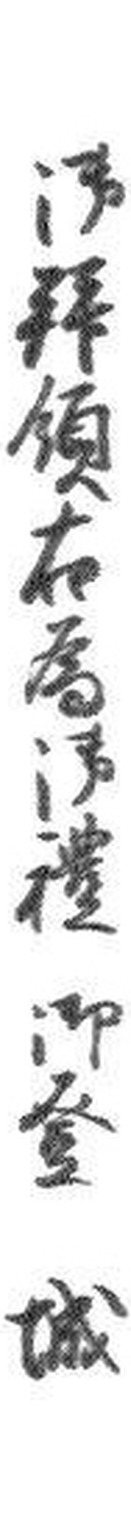御拝領右為御礼御登城
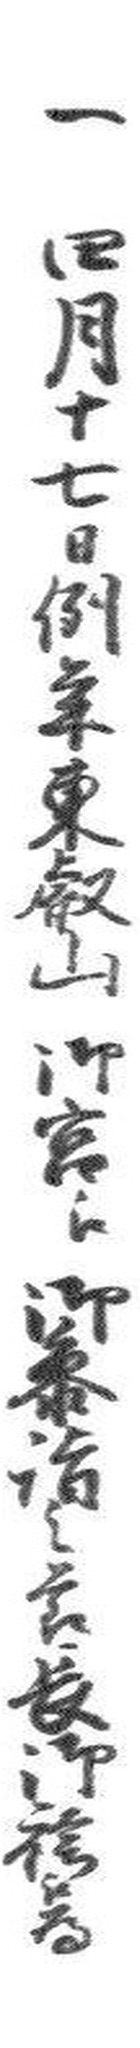一四月十七日例年東叡山御宮江御参詣之節長御袴被為
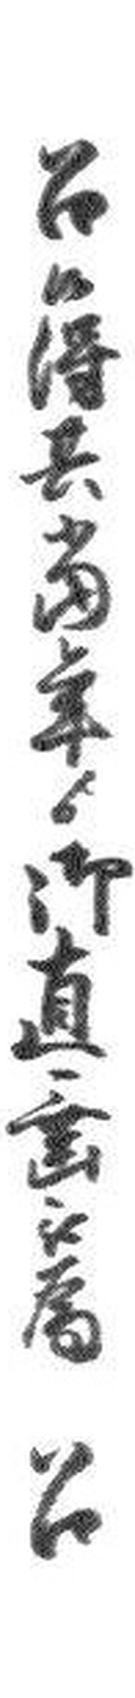召候得共当年ゟ御直垂被為召
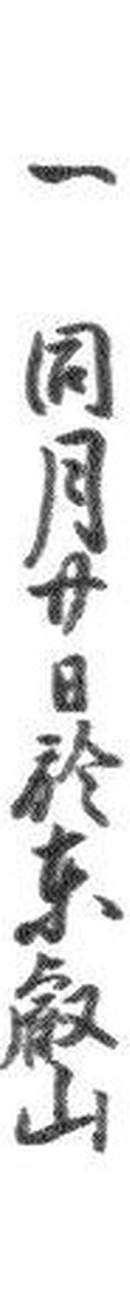一同月廿日於東叡山
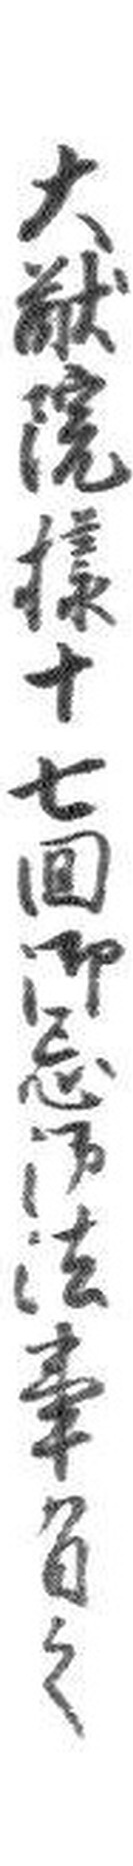大猷院様十七回御忌御法事有之
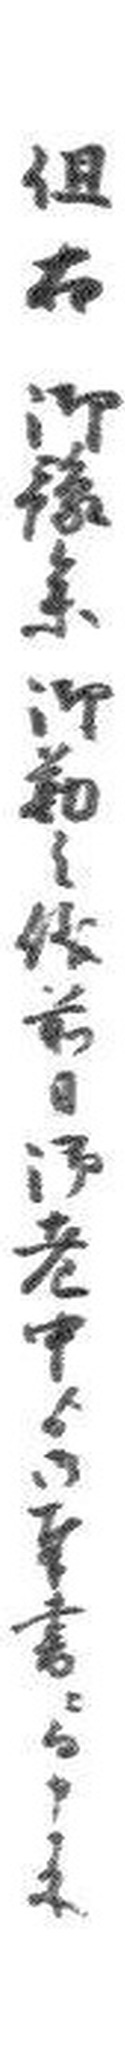但右御予参御勤之儀前日御老中ゟ御奉書ニ而申来
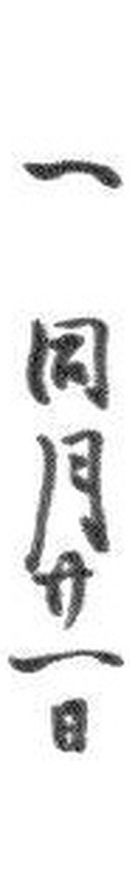一同月廿一日

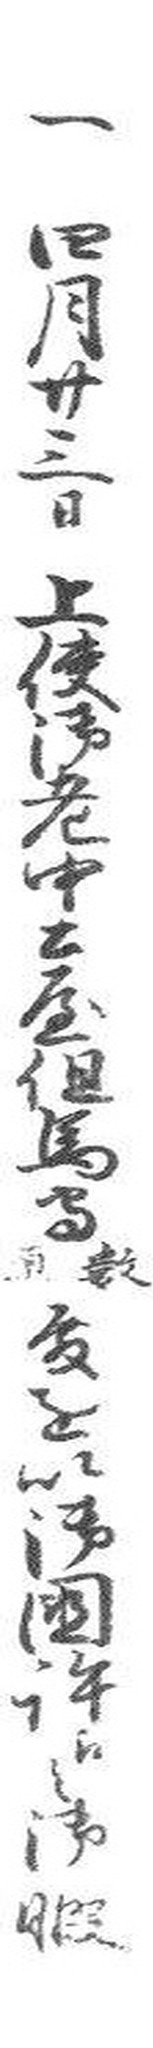一四月廿三日上使御老中土屋但馬守数直殿を以御国許江之御暇
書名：家譜 七 光通公 従寛文四年到同九年
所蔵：福井県文書館 Fukui Prefectural Archives
